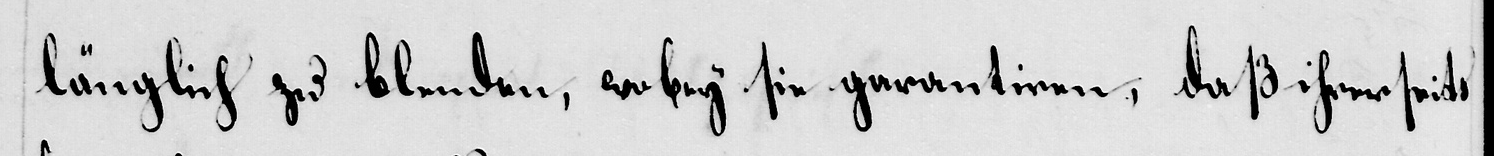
länglich zu blenden, wobey sie garantiren, daß ihrerseits
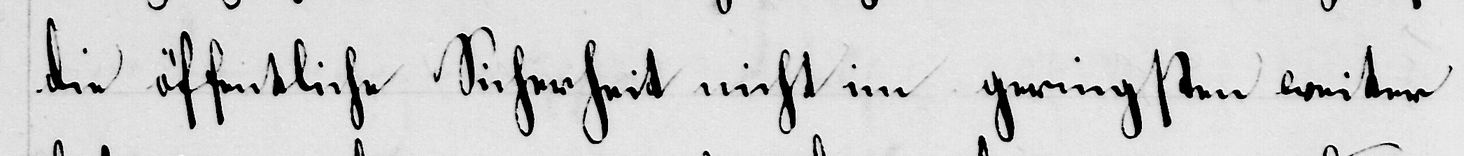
die öffentliche Sicherheit nicht im geringsten weiter
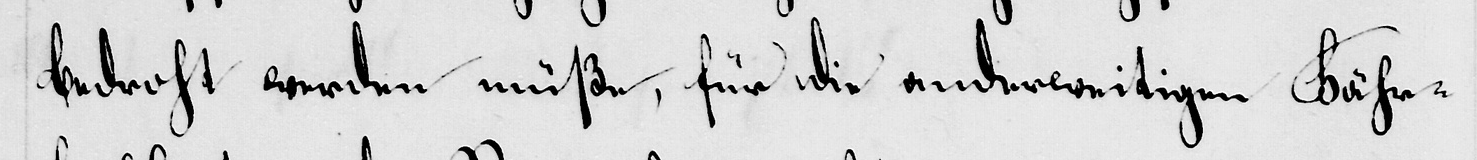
bedroht werden müße, für die anderweitigen Fähr¬
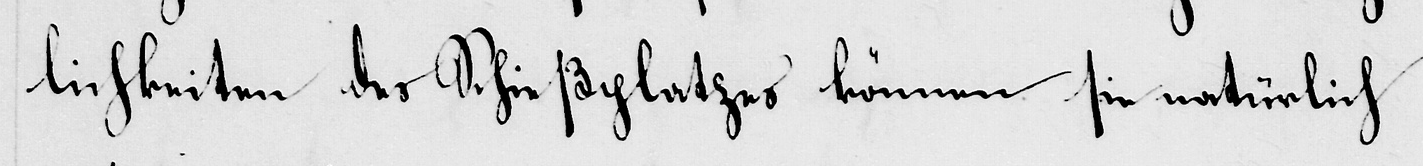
lichkeiten des Schießplatzes können sie natürlich
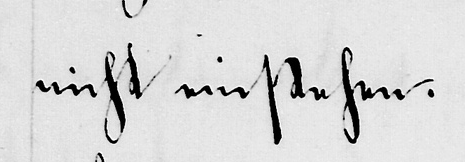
nicht einstehen.
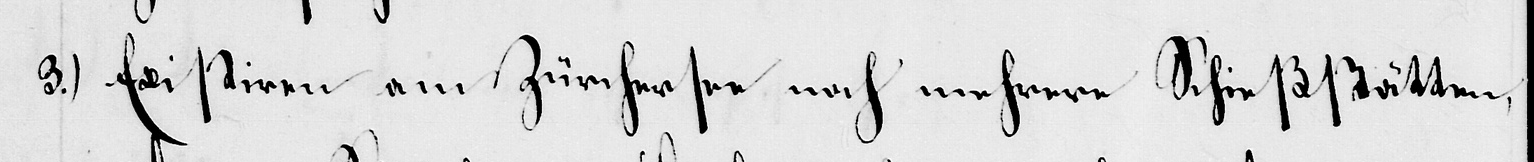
3.) Existiren am Zürchersee noch mehrere Schießstätten,
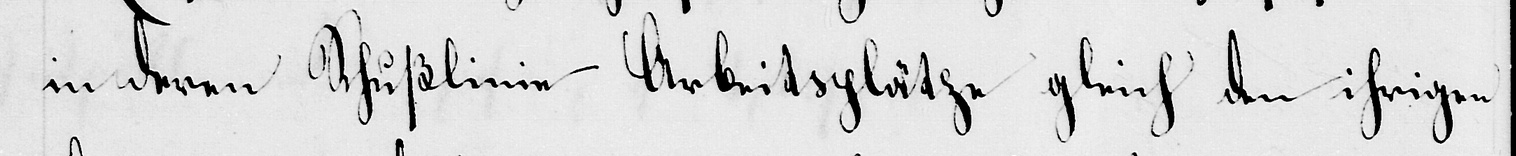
in deren Schußlinie Arbeitsplätze gleich den ihrigen
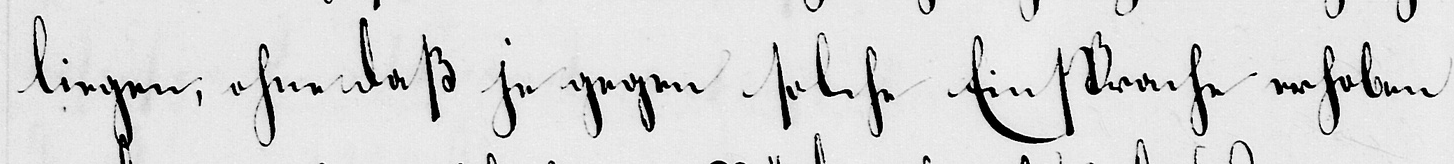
liegen, ohne daß je gegen solche Einsprache erhoben
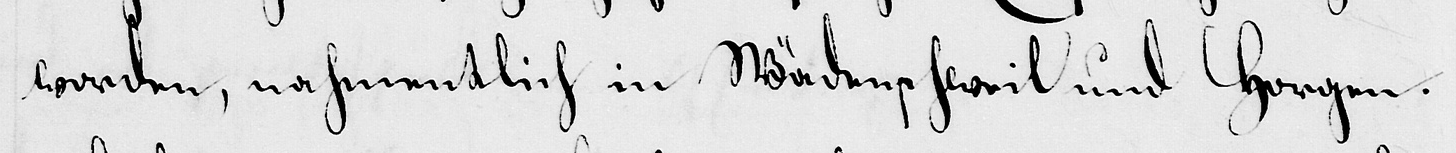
worden, nahmentlich in Wädenschweil und Horgen.
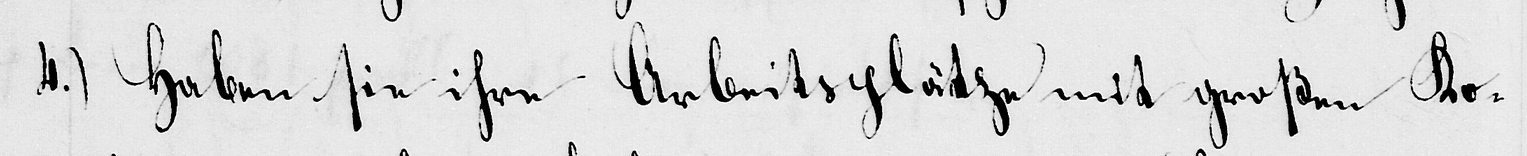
4.) Haben sie ihre Arbeitsplätze mit großen Ko¬
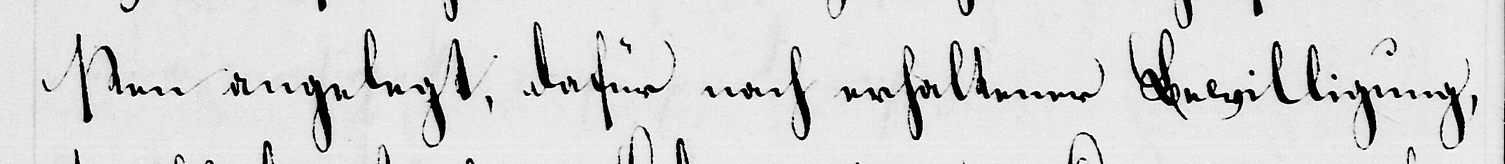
sten angelegt, dafür nach erhaltener Bewilligung,
